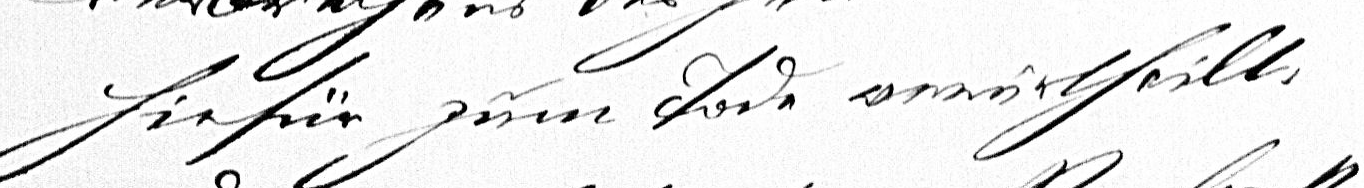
hiefür zum Tode verurtheilt.
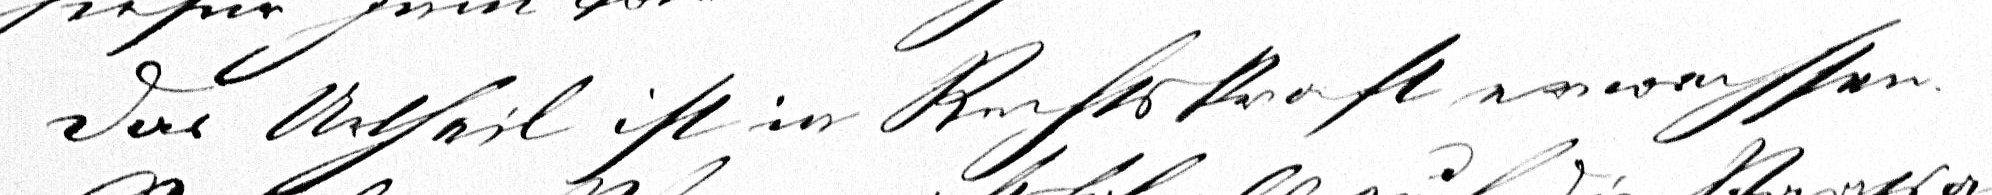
Das Urtheil ist in Rechtskraft erwachsen.
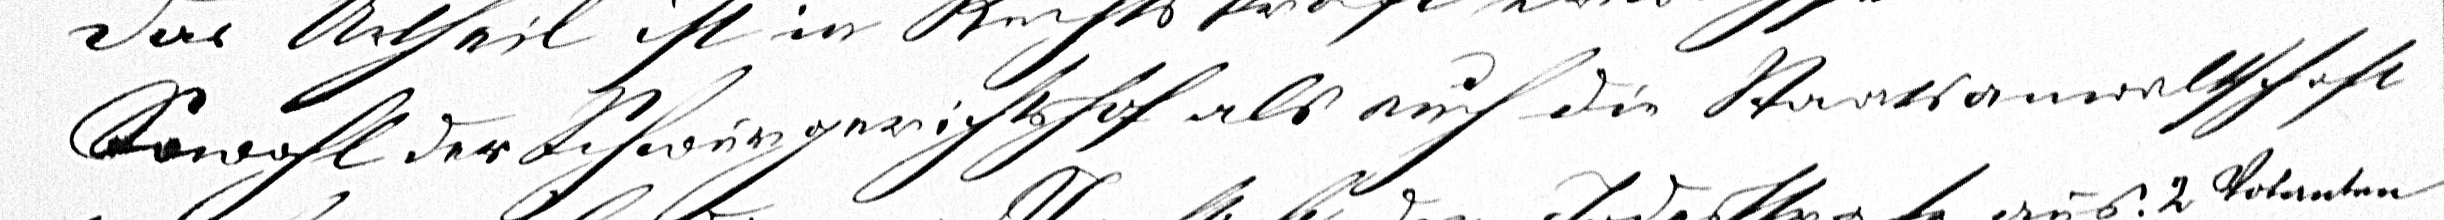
Sowohl der Schwurgerichtshof als auf die Staatsanwaltschaft
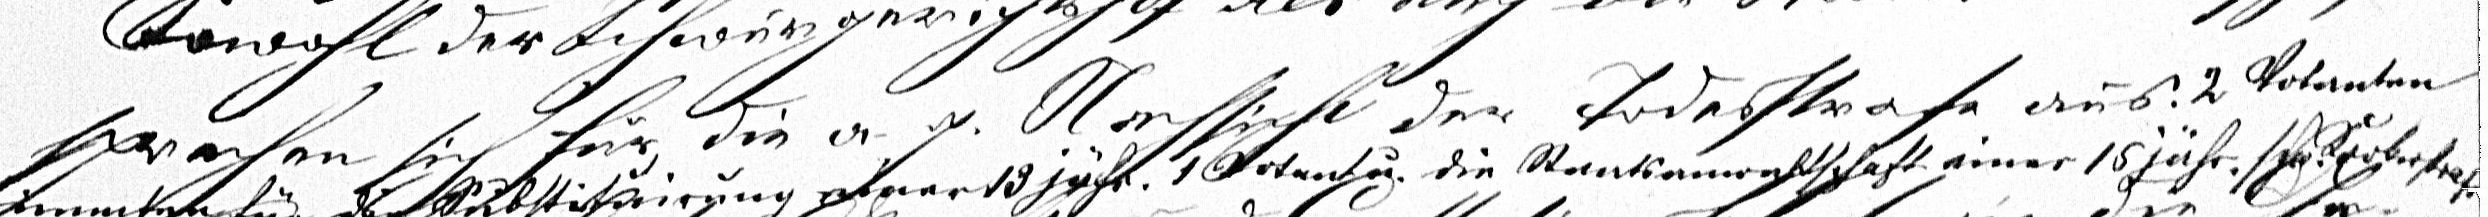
sprechen sich für die a. p. Nachsicht der Todesstrafe aus. 2 Votanten
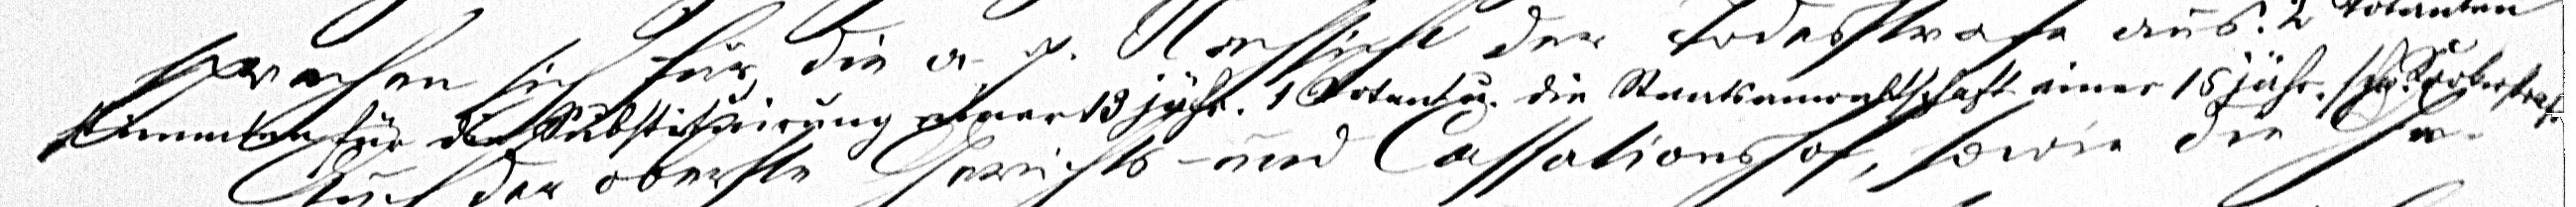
stimmten für die Substituirung einer 13 jähr. 1 Votantu. die Staatsanwaltschaft einer 15jähr. schw. Kerkerhaft
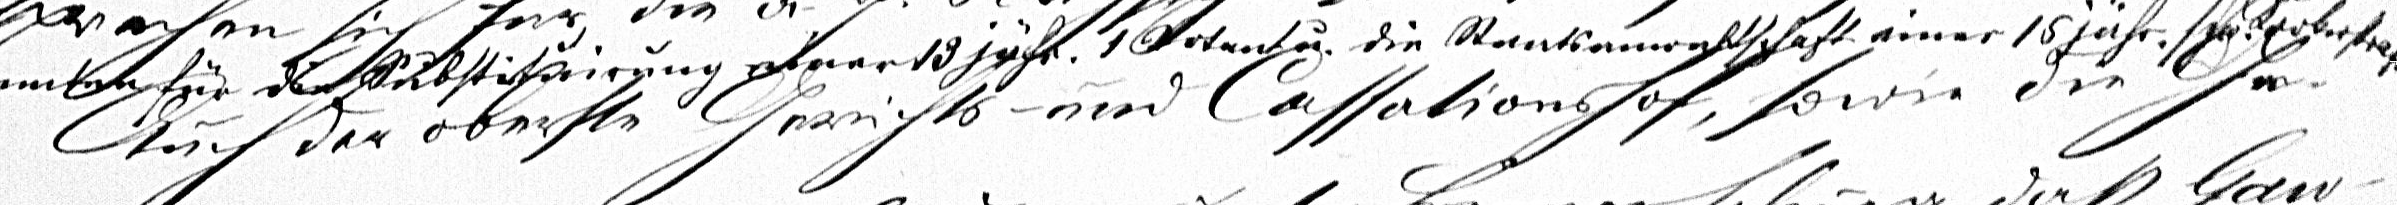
Auch der oberste Gerichts- und Cassationshof, sowie die Ge¬
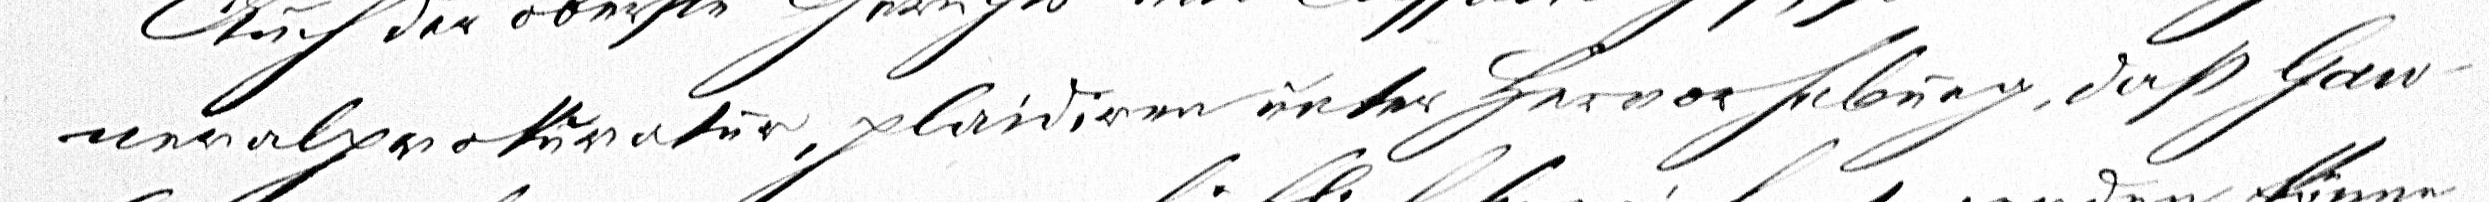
neralprokuratur, plaidiren unter Hervorhebung, daß Gaw¬
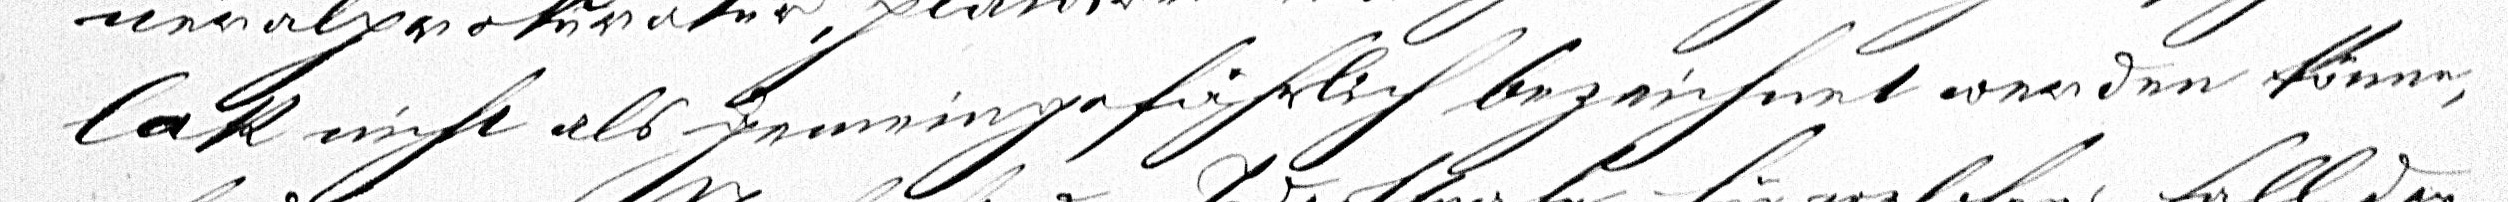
lak nicht als Gemeingefährlich bezeichnet werden könne,
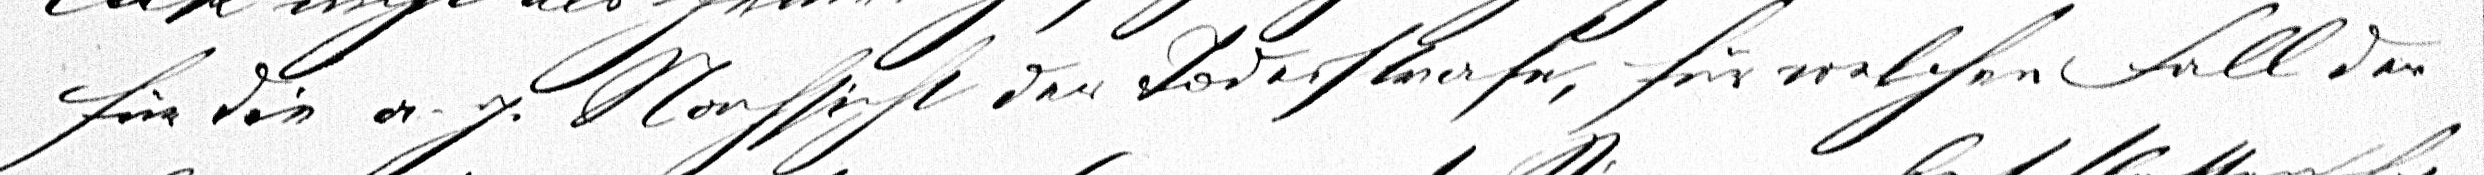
für die a. p. Nachsicht der Todesstrafe, für welchen Fall der
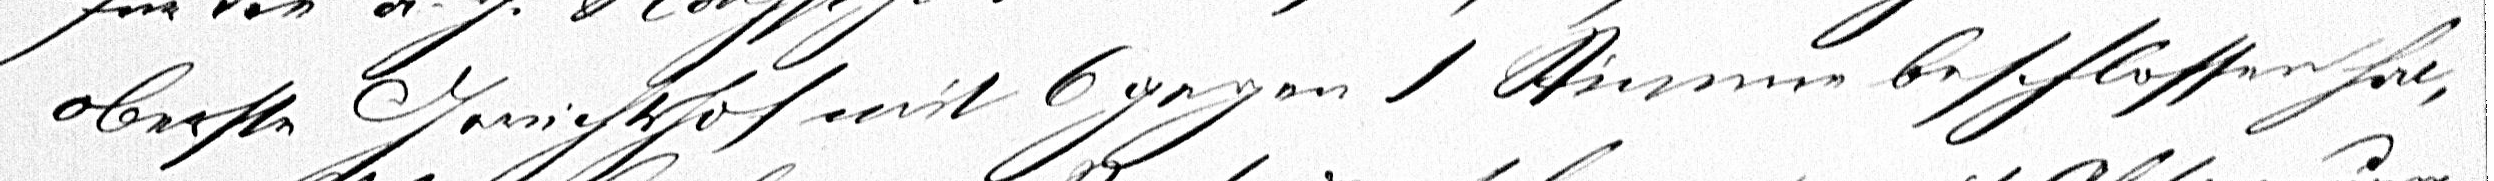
oberste Gerichtshof mit 6 gegen 1 Stimme beschlossen hat,
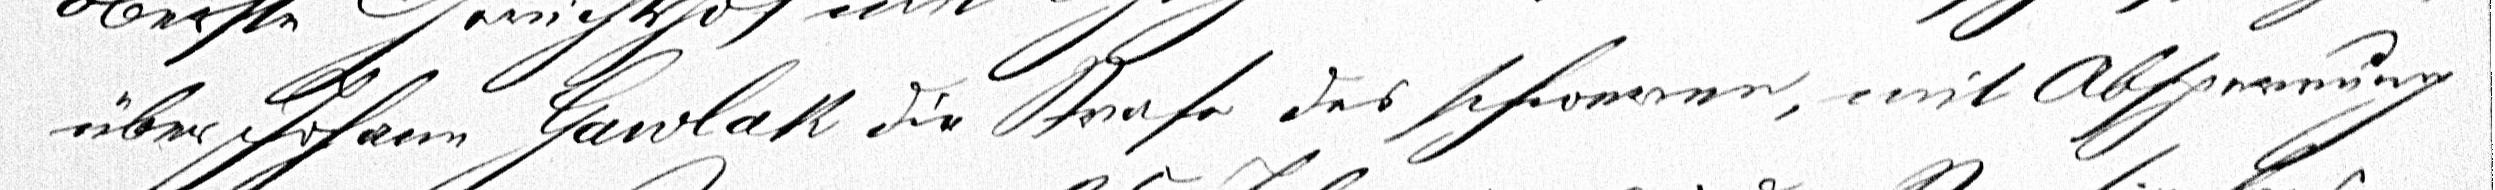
über Johann Gawlak die Strafe des schweren, mit Absperrung
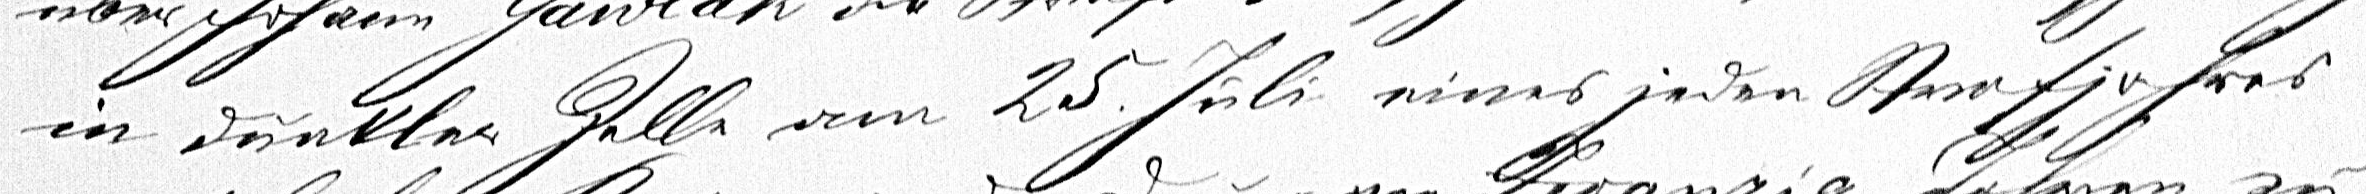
in dunkler Zelle am 25. Juli eines jeden Strafjahres
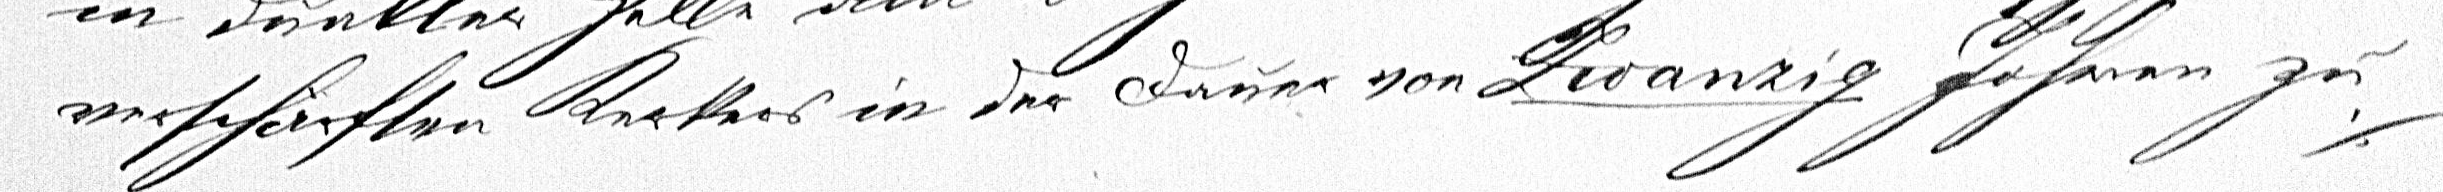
verschärften Kerkers in der Dauer von Zwanzig Jahren zu
